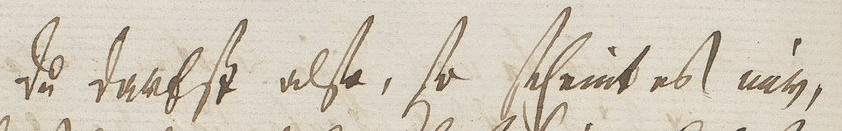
Du darfst also, so scheint es mir,
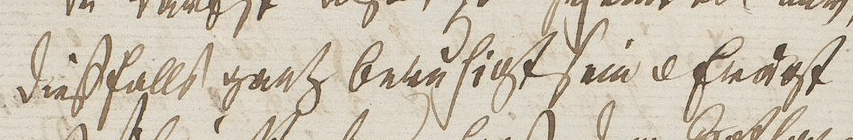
dießfalls ganz beruhigt sein & frägt
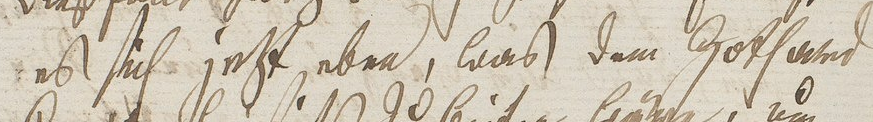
es sich jezt eben, was dem Gothard
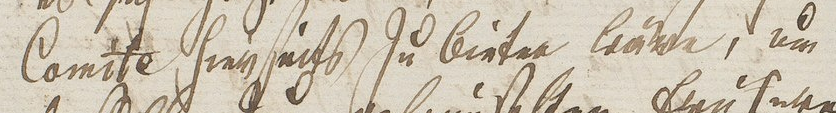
Comité hierseits zu bieten wäre, um
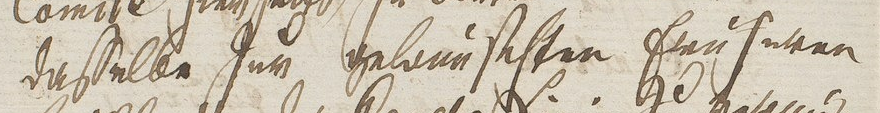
dasselbe zur gewünschten früheren
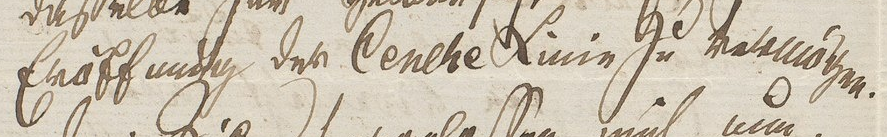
Eröffnung der Cenere Linie zu vermögen.
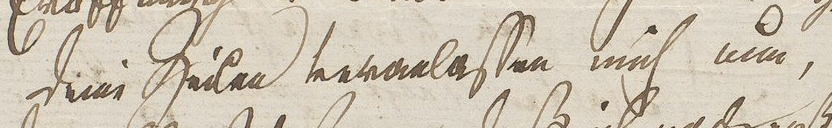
Deine Zeilen veranlassen mich nun,
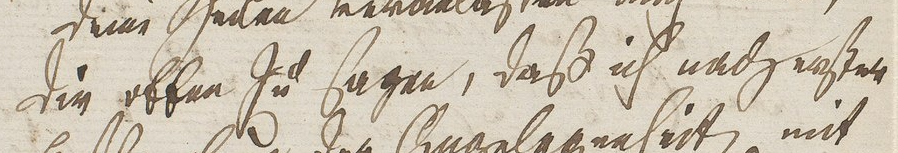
Dir offen zu sagen, daß ich nach erster
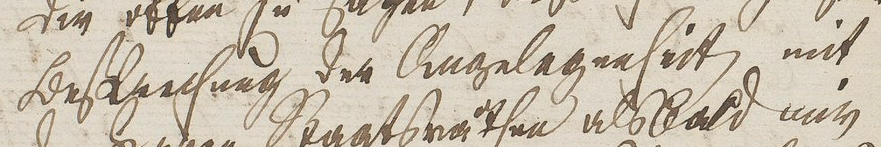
Besprechung der Angelegenheit mit
